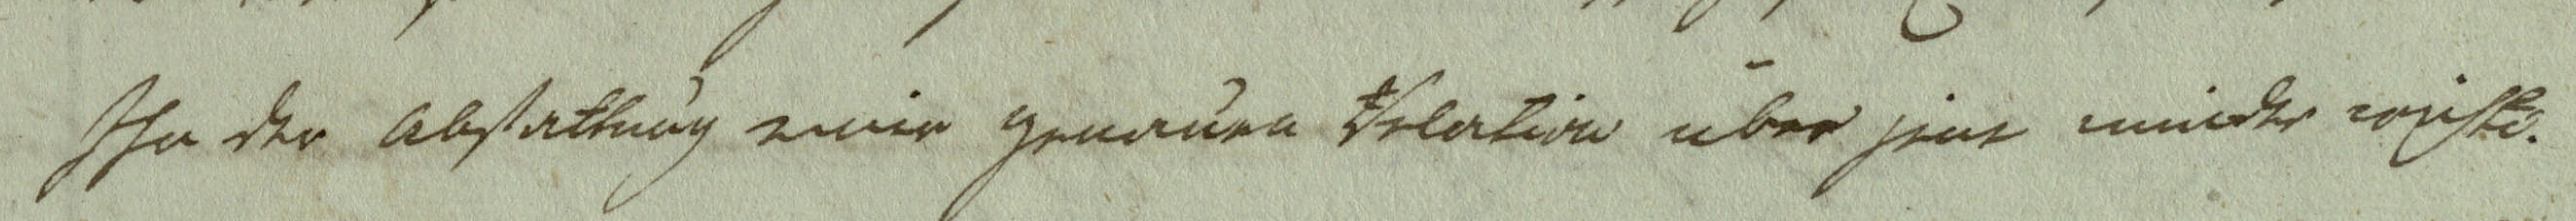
Ihn der Abstattung einer genauen Relation über jene minder wichti¬
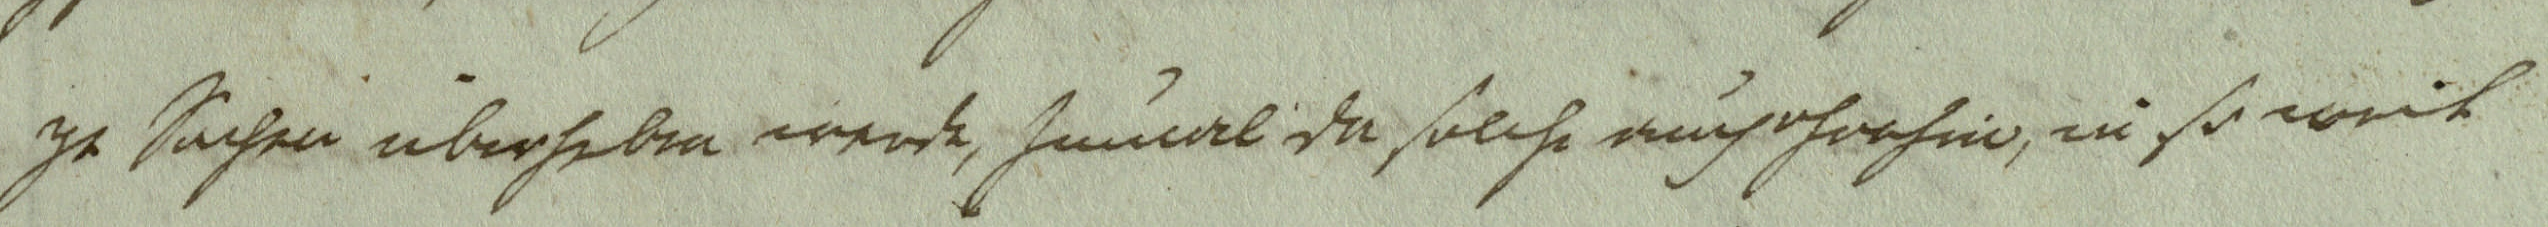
ge Sachen überheben werde, zumal da solche auch ohnehin, in so weit
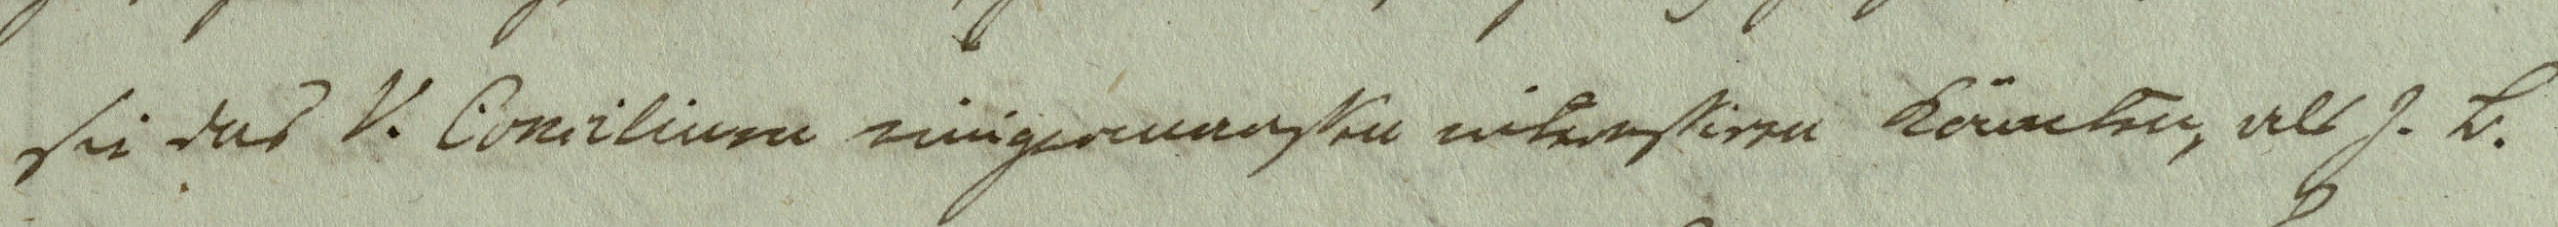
sie das V. Concilium einigermassen interessiren könnten, als z. B.
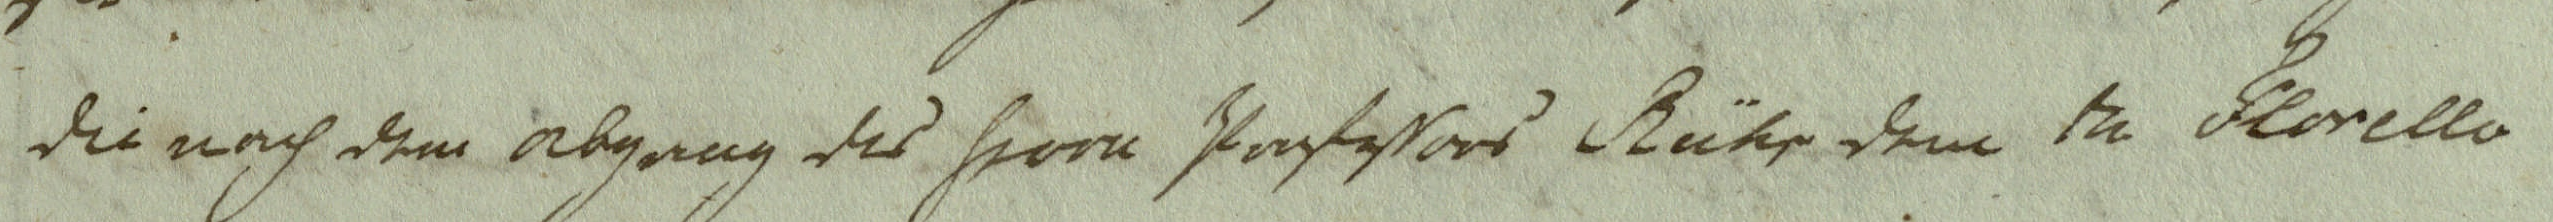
die nach dem Abgang des Herrn Professors Rühs dem M. Florello
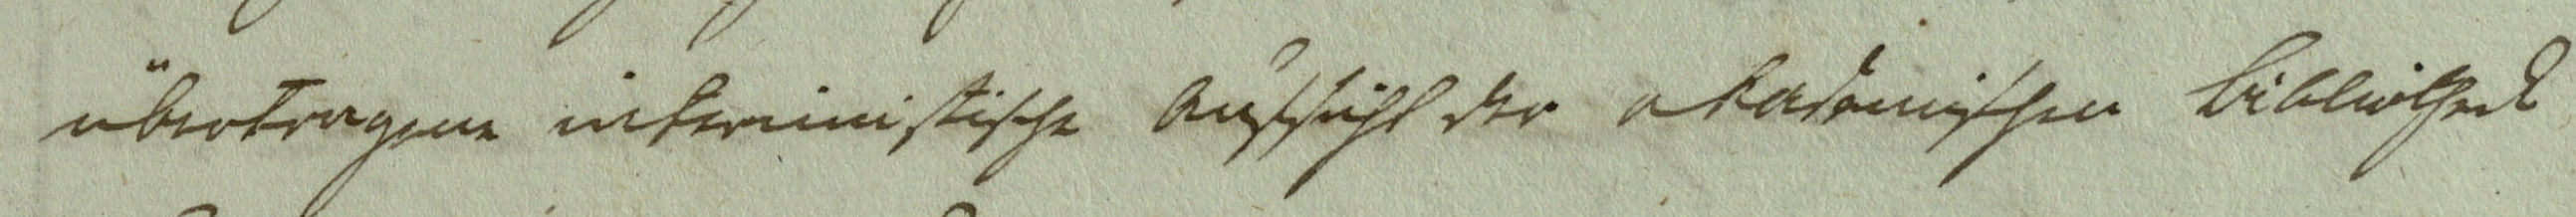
übertragene interimistische Aufsicht der akademischen Bibliotheck
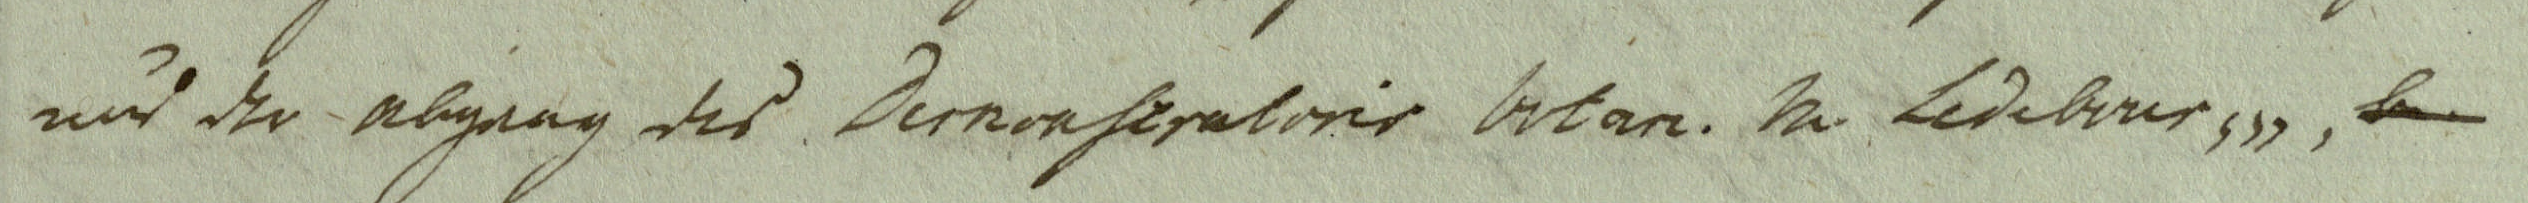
und der Abgang des Demonstratoris botan. M. Ledebour, be
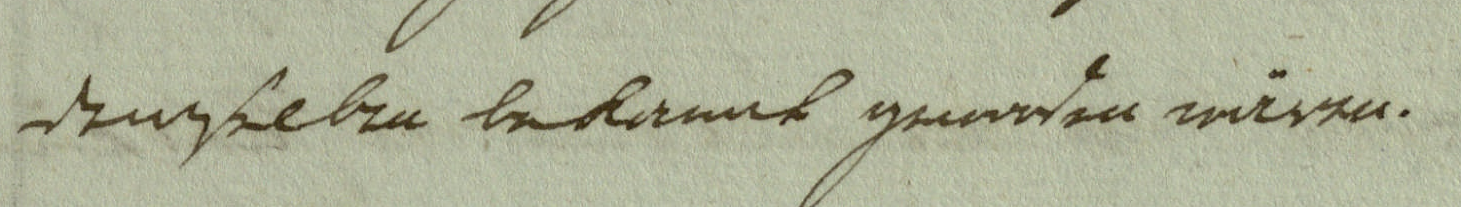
demselben bekannt geworden wären.
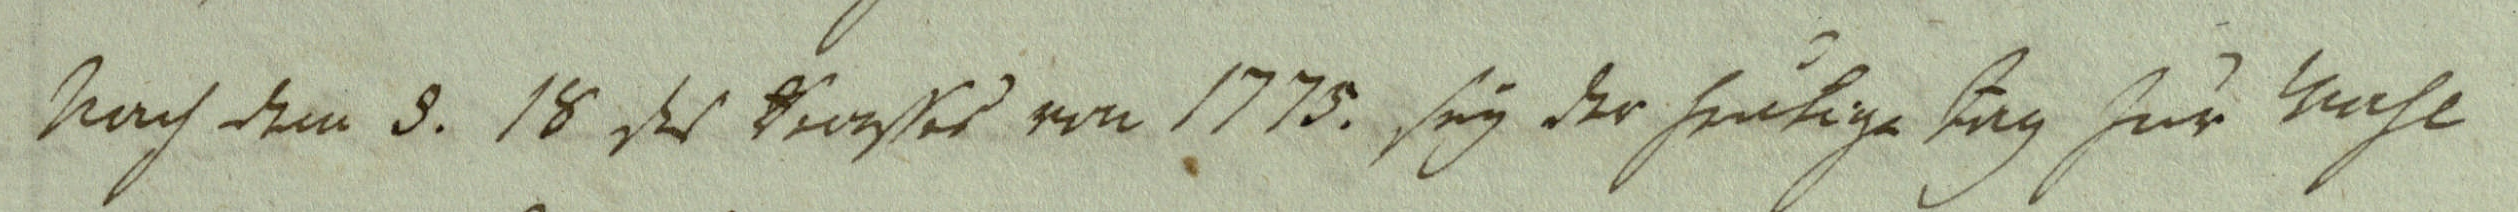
Nach dem §. 18 des Recesses von 1775. seÿ der heutige Tag zur Wahl
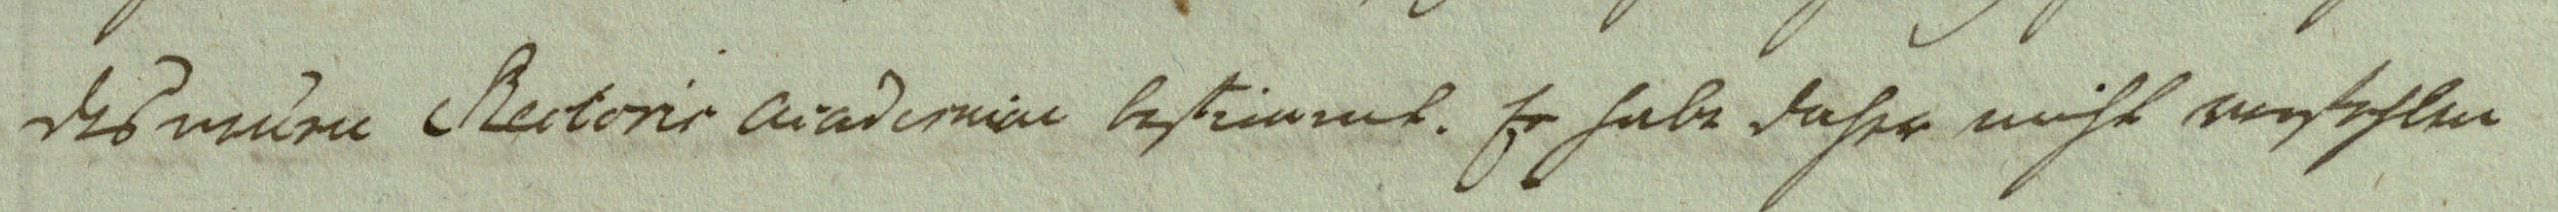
des neuen Rectoris Academiae bestimmt. Er habe daher nicht verfehlen
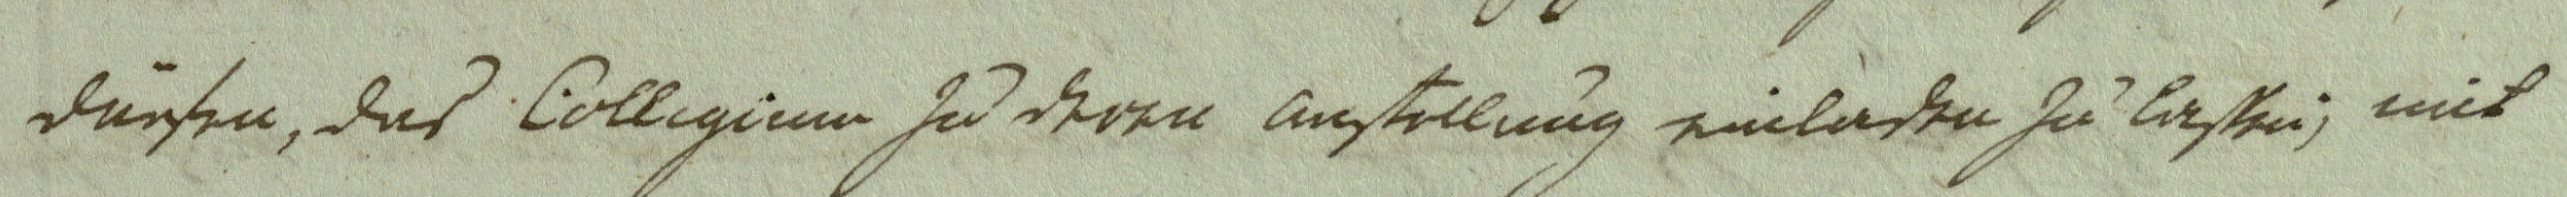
dürfen, das Collegium zu deren Anstellung einladen zu lassen; mit
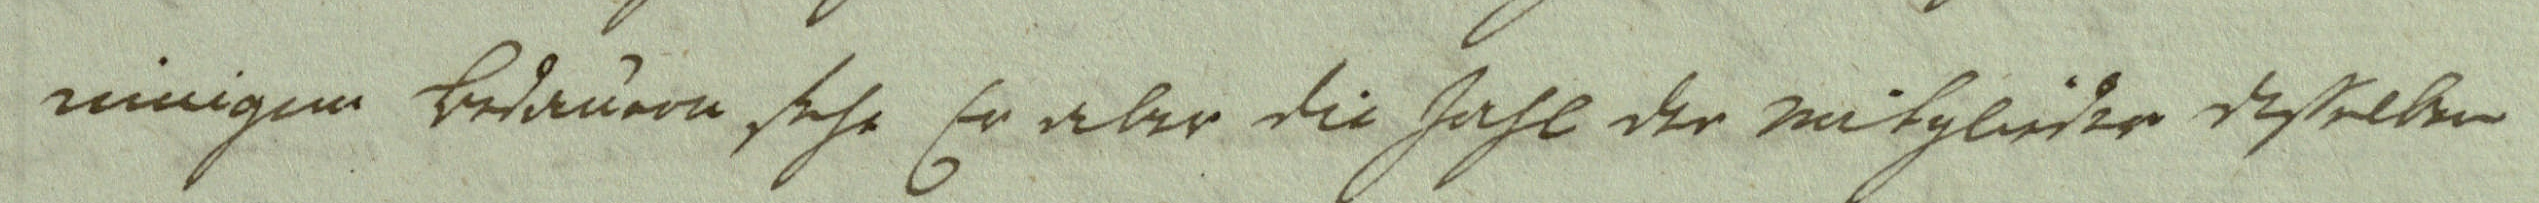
einigem Bedauern sehe Er aber die Zahl der Mitglieder desselben
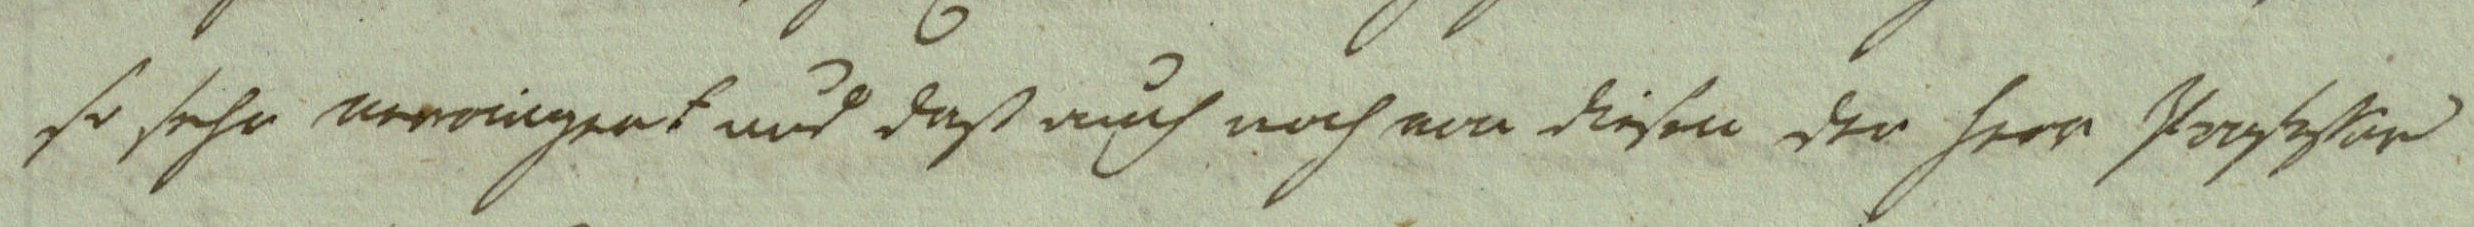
so sehr verringert und daß auch noch von diesen der Herr Professor
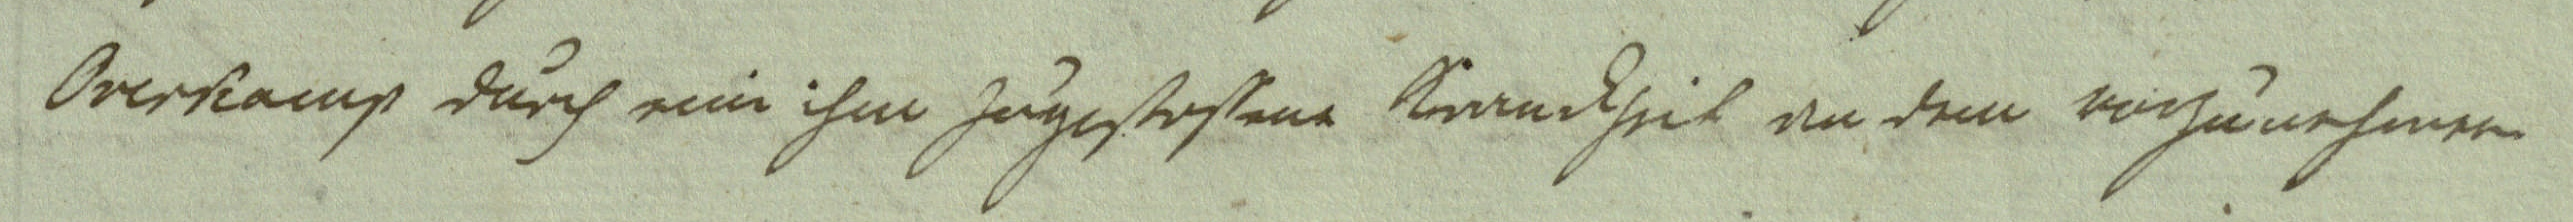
Overkamp durch eine ihm zugestossene Kranckheit an dem vorzunehmen¬
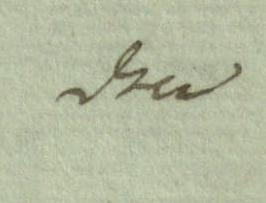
den
